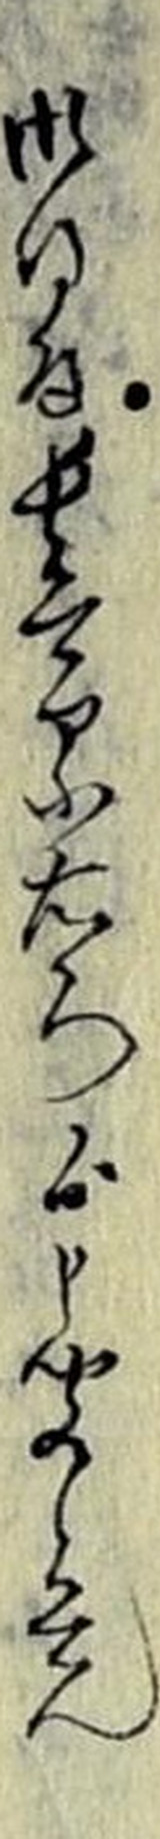御目付長谷部小右衛門ゟ申聞候覚
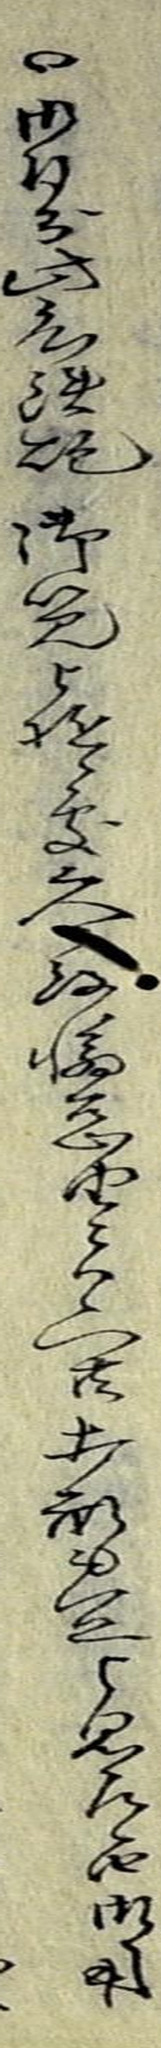〇御自分此度鉄炮御覧被遊候処久々致懈怠由ニハ候へ共打形も宜被思召候由御用
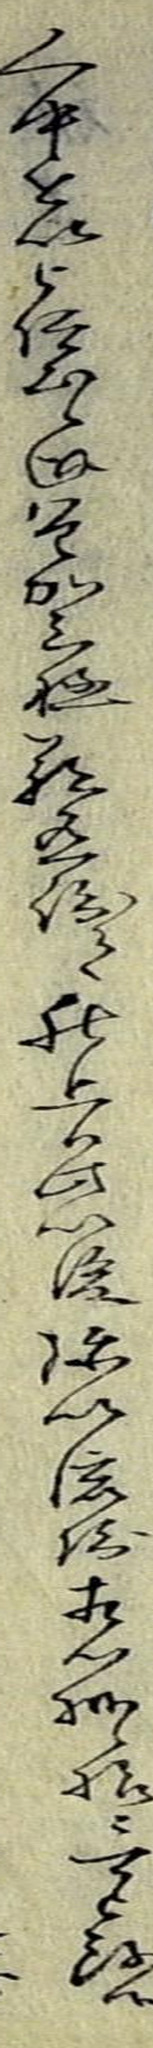人中を以被仰出候趣冥加至極難有儀ニ候然上ハ此以後弥以流儀相心掛候様ニ可被致候
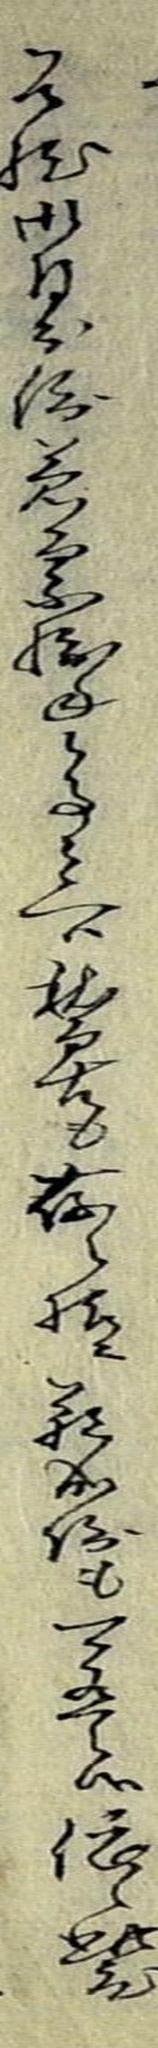乍然御自分儀兼而不勝手之事ニ候ヘハ稽古も存候様ニ難成儀も可有之候依之此度
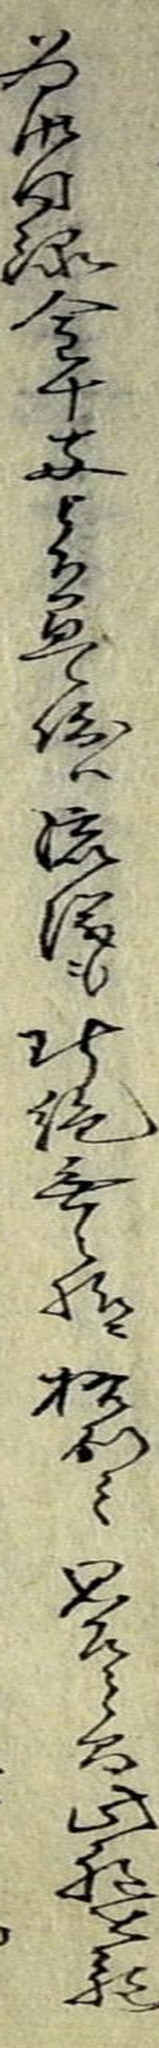為御目録金十両被下置候儀ハ流儀も断絶無之様ニ格別之思召ニ候間此程を難
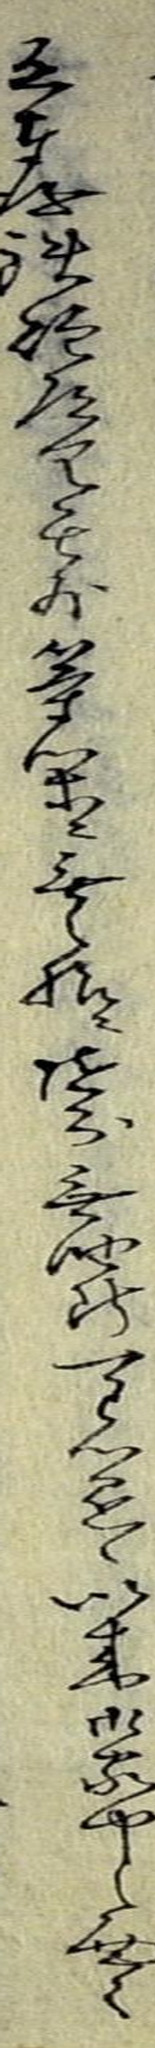有奉存鉄炮道具其外等閑ニ無之様ニ随分無油断可被心懸候以来御家中之面々
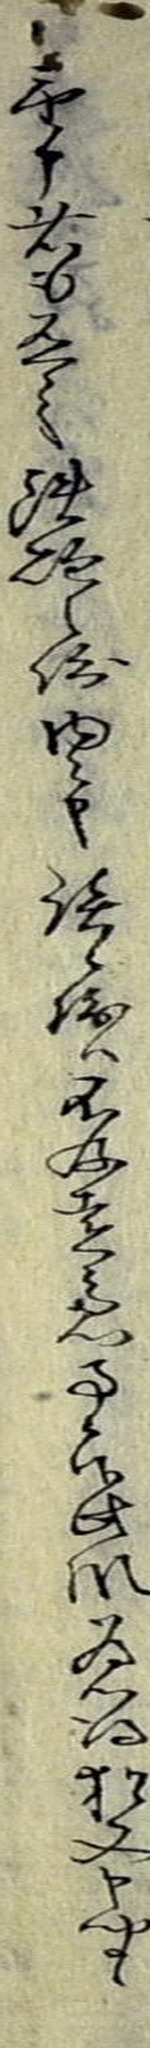望申者も有之鉄炮之儀内々申談候儀ハ不及遠慮事ニ候此段為心得猶又申聞候
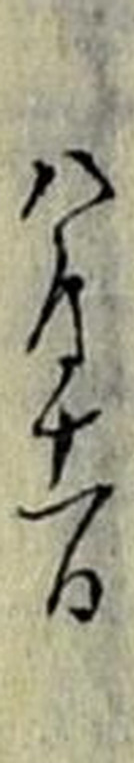八月十一日
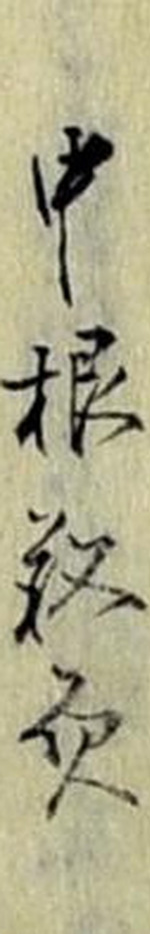中根靱負
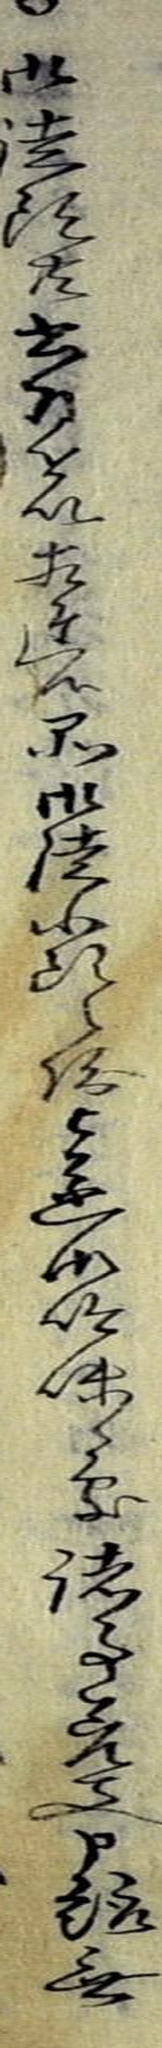〇御徒頭共書付を以相達候品御徒小頭之儀被遂御吟味候処諸事差支申趣無
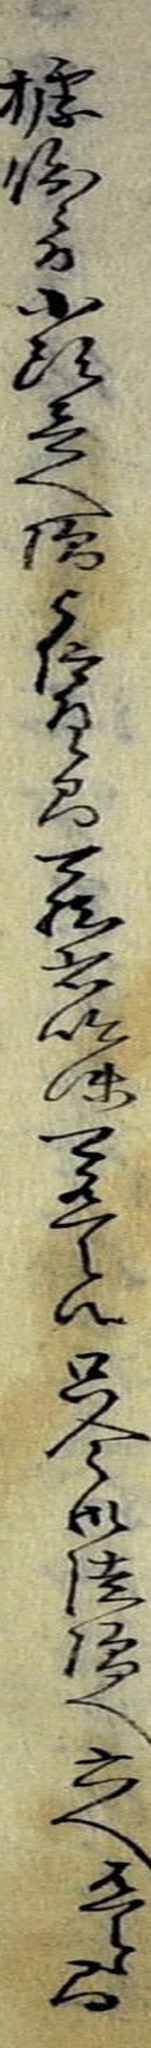拠儀ニ付小頭壱人増被仰付候間可然者吟味可有之候只今御徒増人六人有之候間
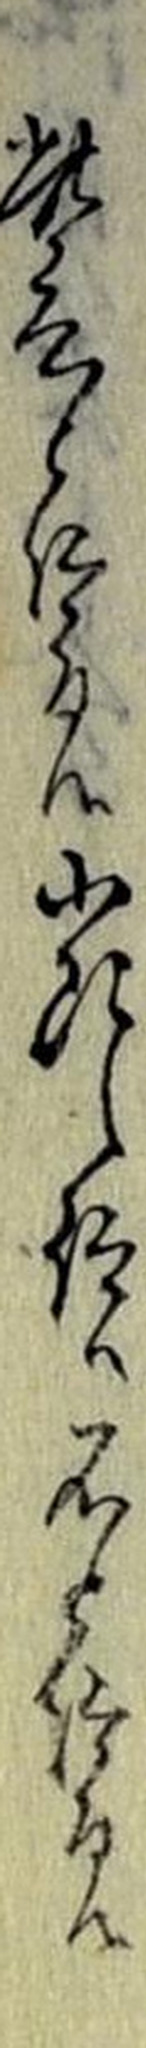此度被仰付候小頭之跡ハ不被仰付候
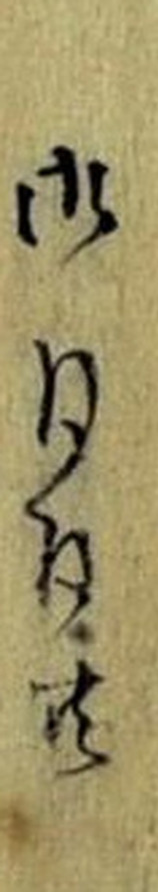御目付共
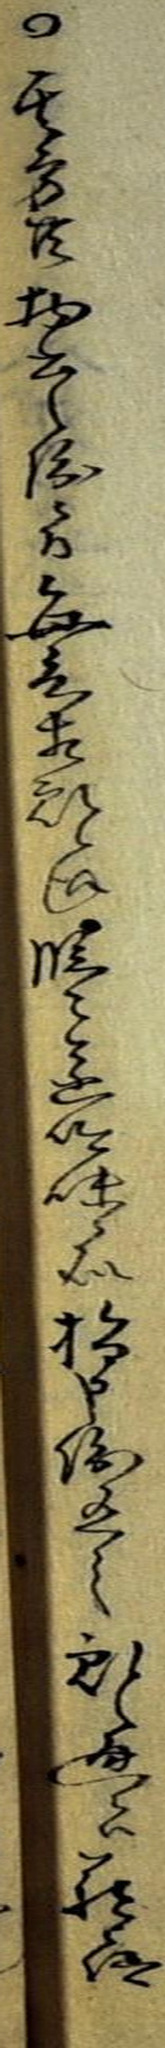〇其方共物書之儀ニ付毎度相願候趣段々遂吟味候処指申儀有之願之通ニハ難被仰
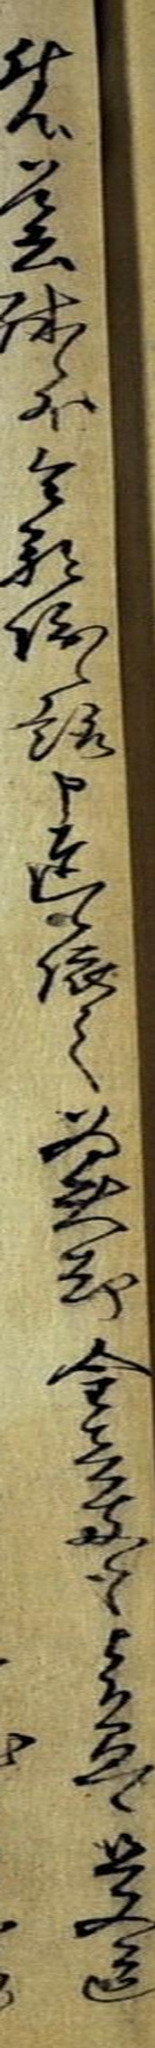付候乍去殊之外令願儀之趣申達候依之為失却金壱両ツヽ被下置候且又道
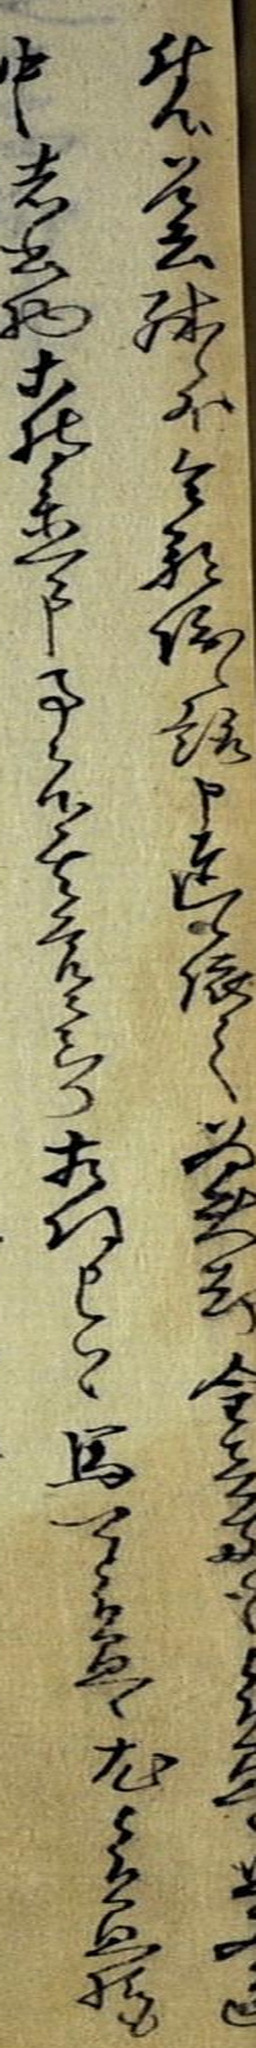中諸書物等持参可申事ニ候其節ニ至り相伺申候ハヽ馬可被下置候尤被下置様も
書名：命令之部 一
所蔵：福井県文書館 Fukui Prefectural Archives
